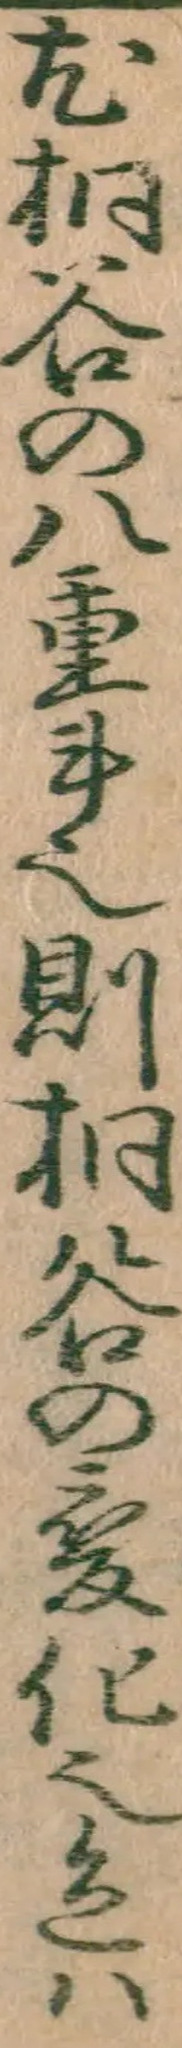尤桐谷の八重斗也則桐谷の変化也色は
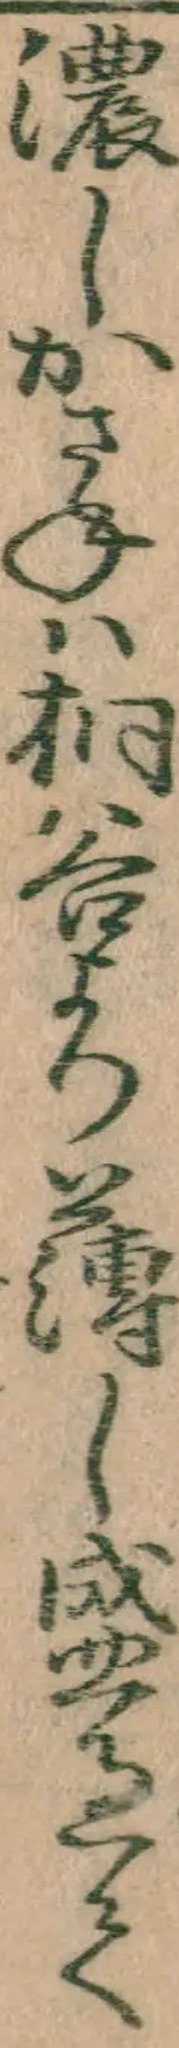濃しかさねは桐谷より薄し盛過て
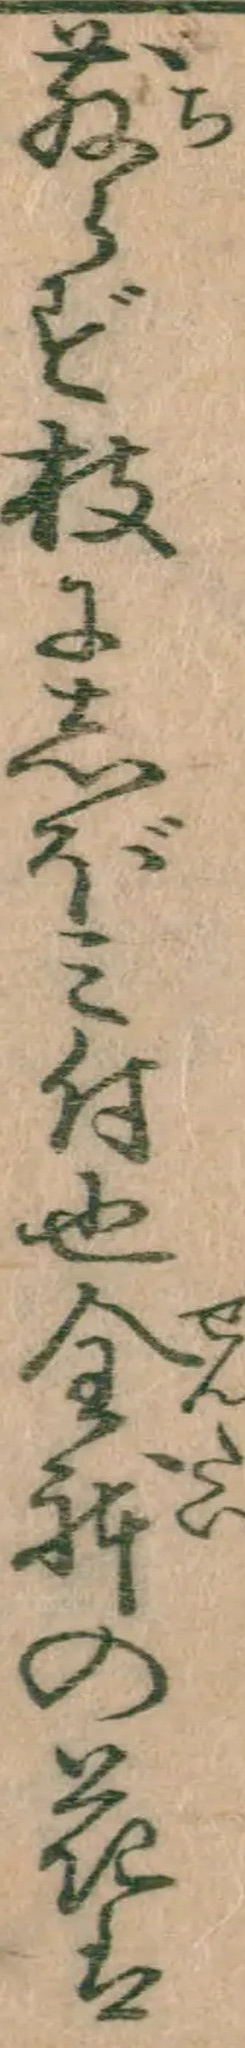散らず枝にしぼみ付也全体の花は
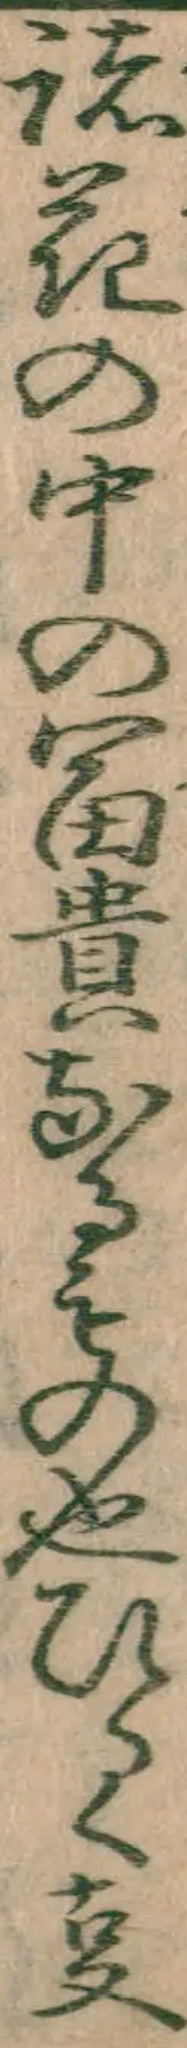諸花の中の富貴なるもの也ひらく事
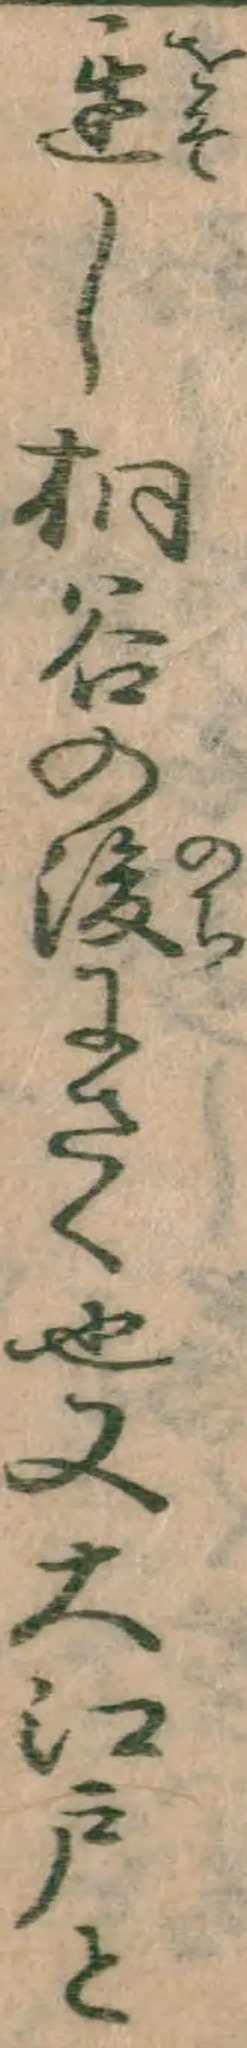遅し桐谷の後にさく也又大江戸と
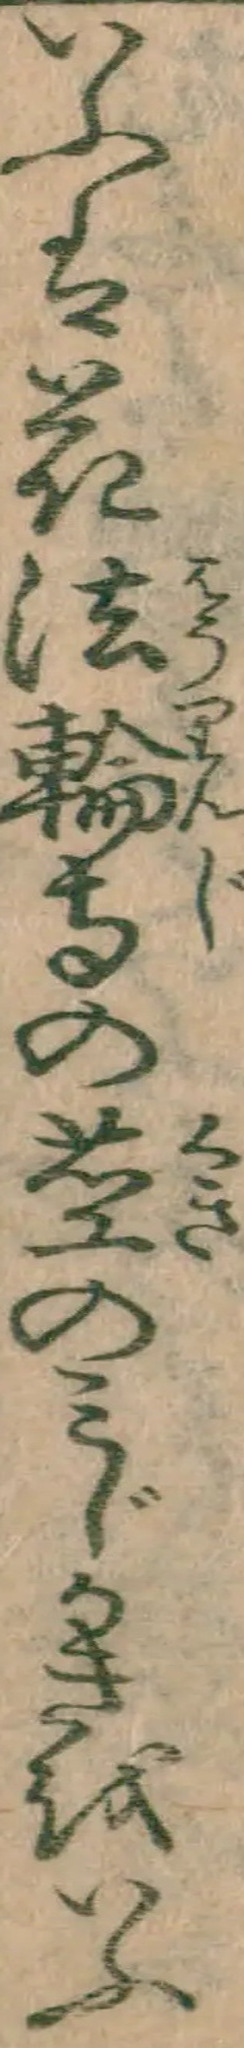いふは花法輪寺の茎のみじかきをいふ

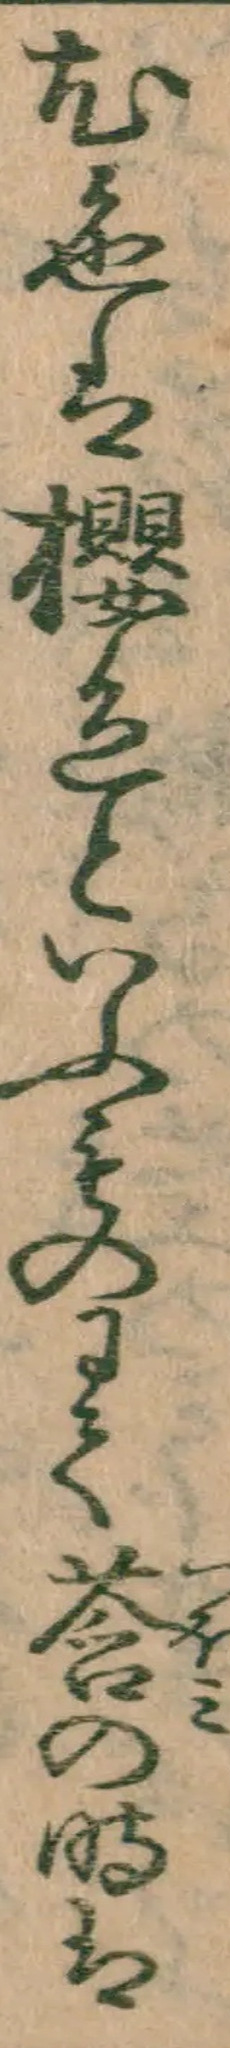尤色は桜色といふものにて莟の時は
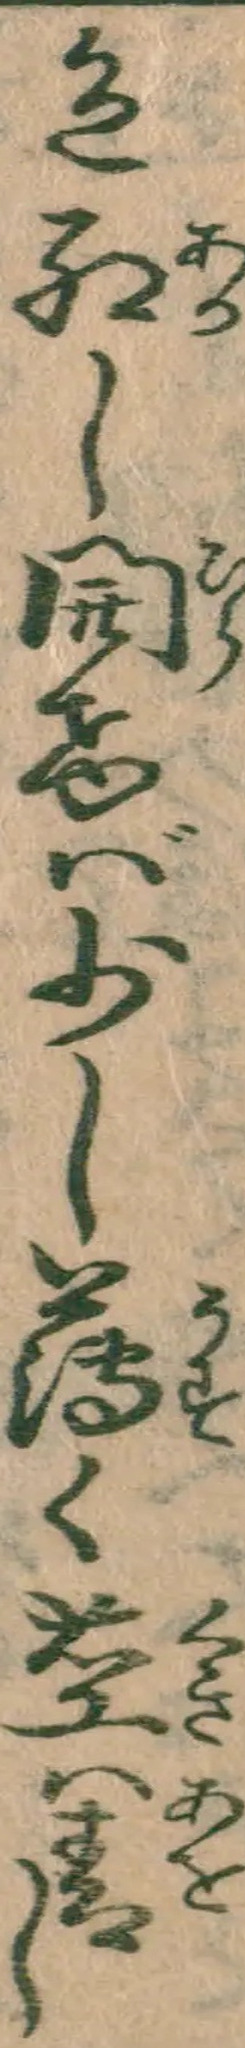色紅し開けば少し薄く茎は青し
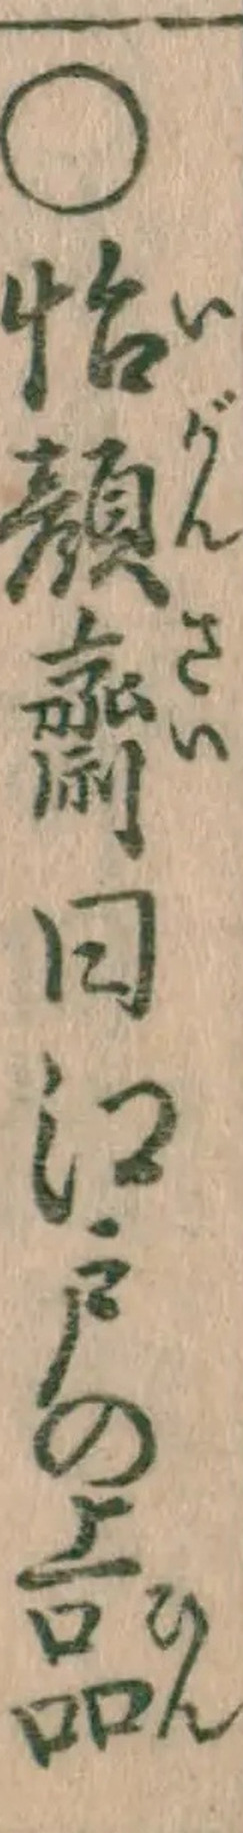○怡顔斎曰江戸の上品
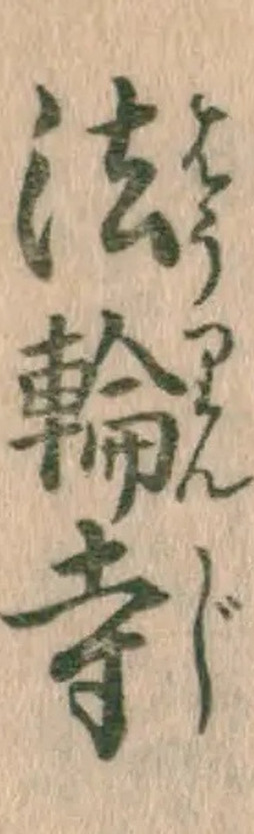法輪寺
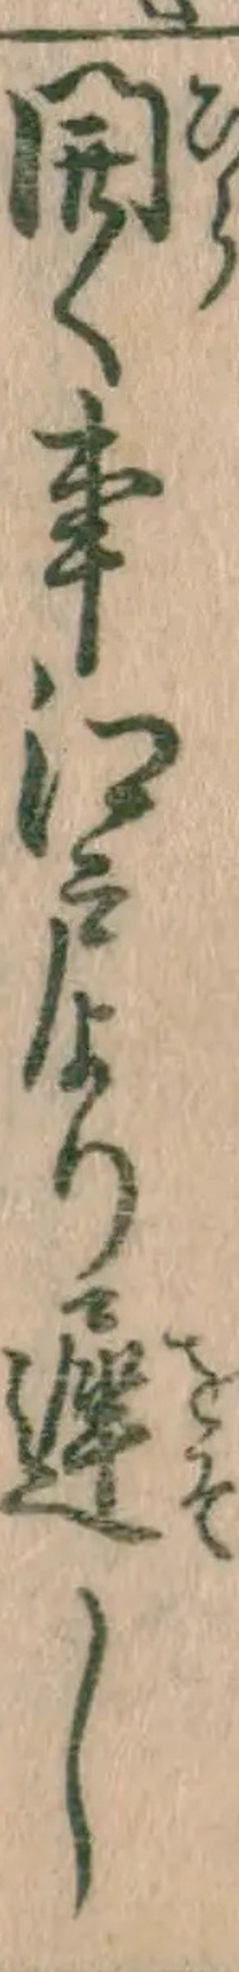開く事江戸より遅し
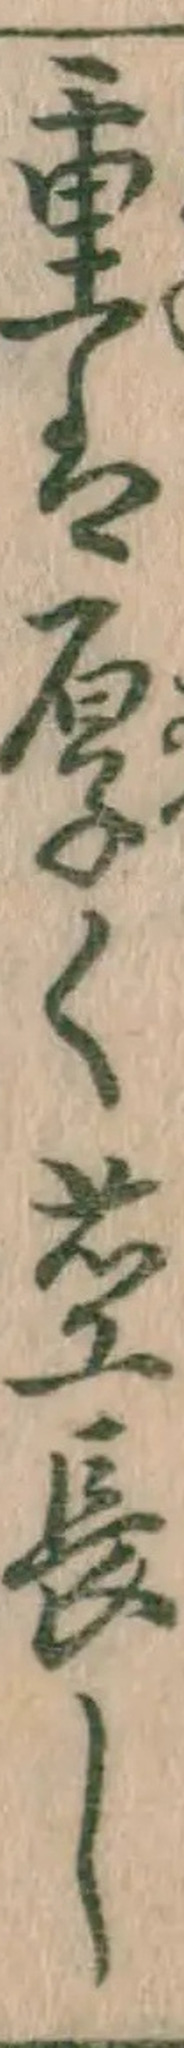重は厚く茎長し
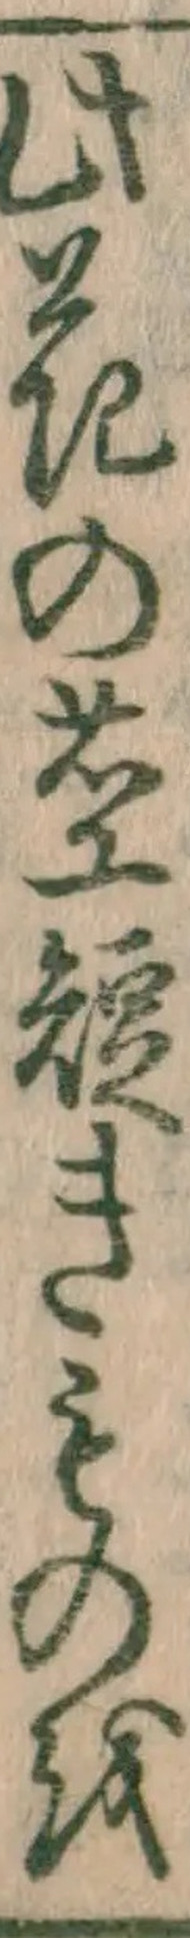此花の茎短きものを
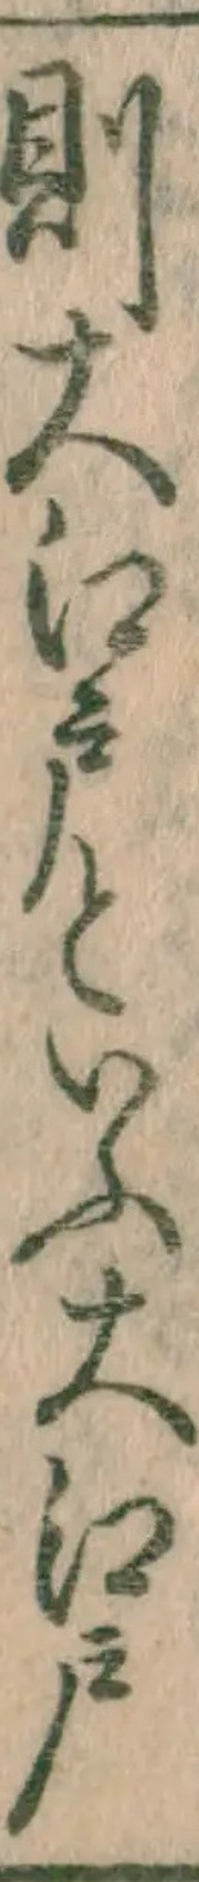則大江戸といふ大江戸

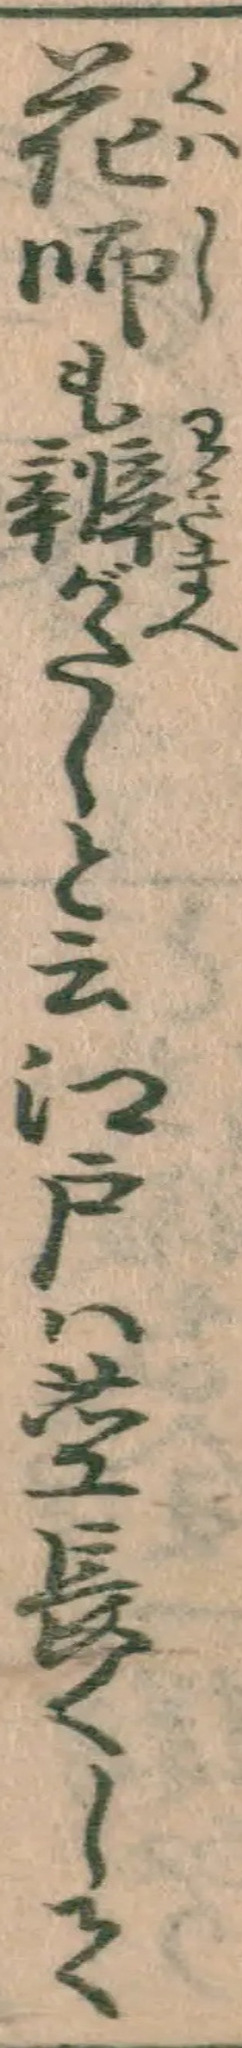花師も弁がたしと云江戸は茎長くして
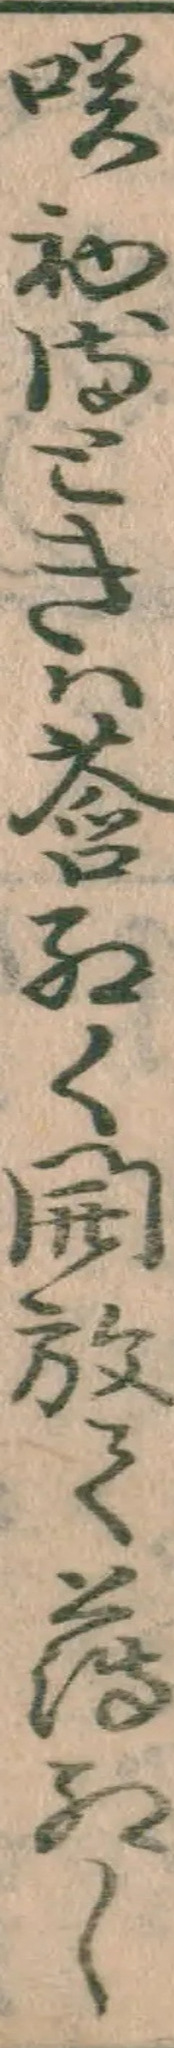咲初るときは莟紅く開放て薄紅し
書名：怡顔齋櫻品
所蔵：国立国会図書館 National Diet Library, JAPAN
